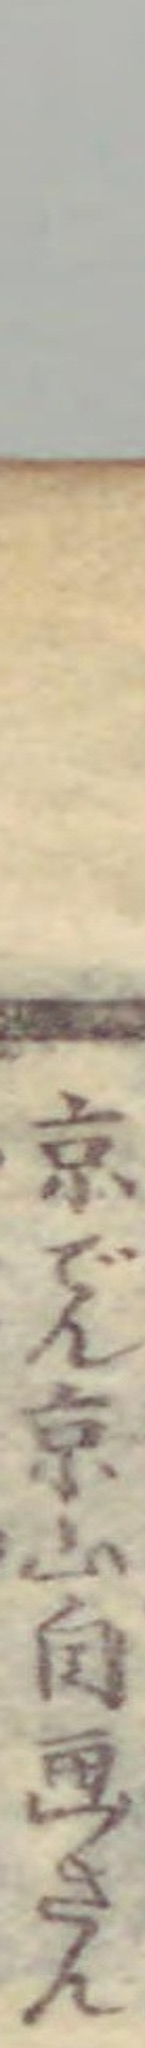京でん京山自画さん
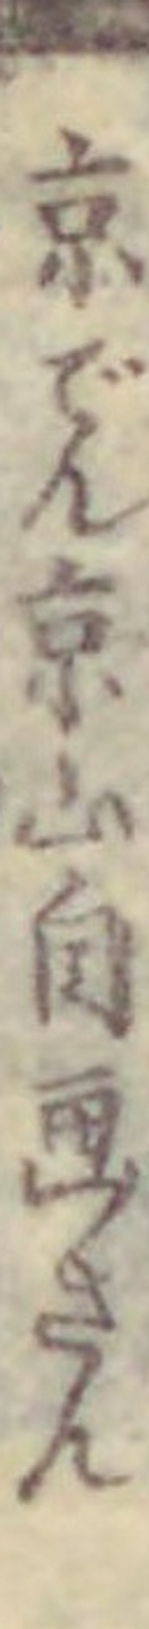京でん京山自画さん
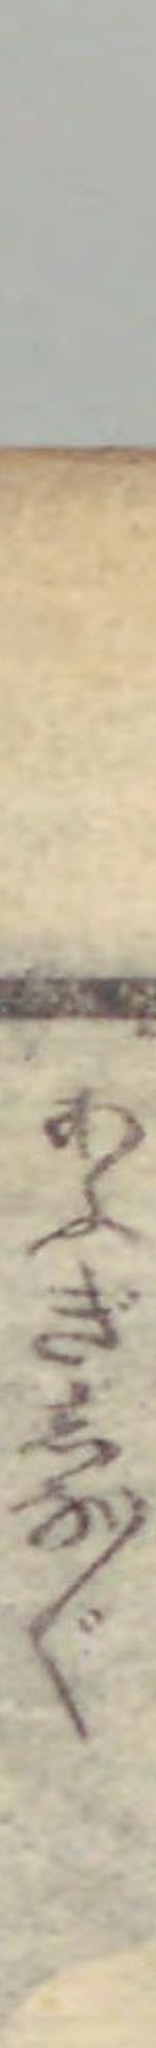あふぎしな〴〵
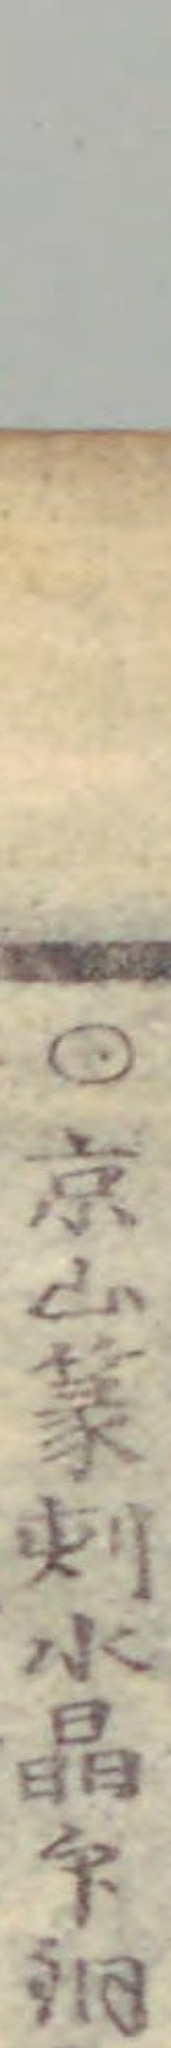○京山篆刻水晶印銅印
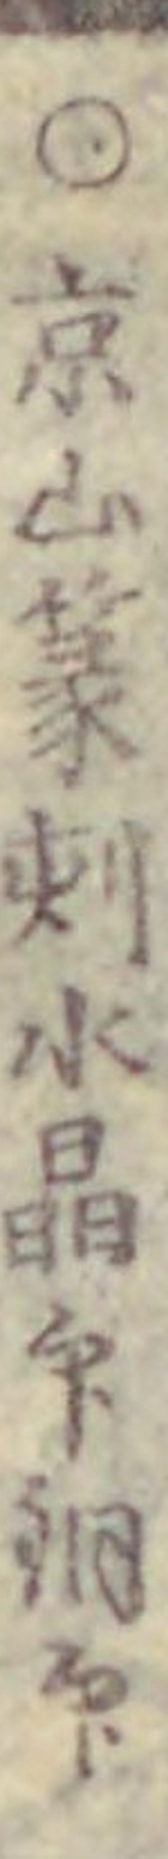○京山篆刻水晶印銅印
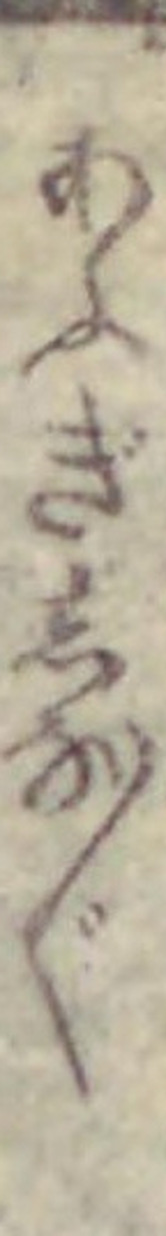あふぎしな〴〵
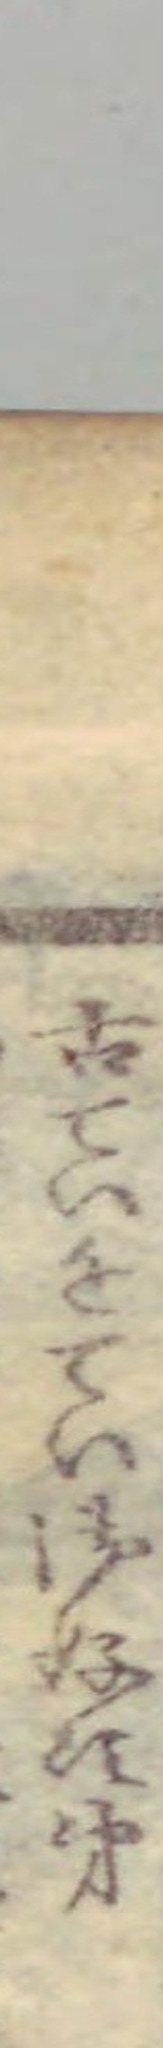古ていをてい御好次第
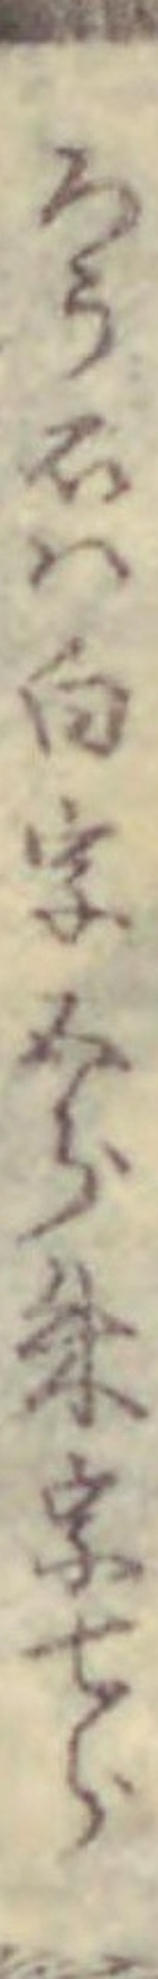ろう石は白字五分朱字七分
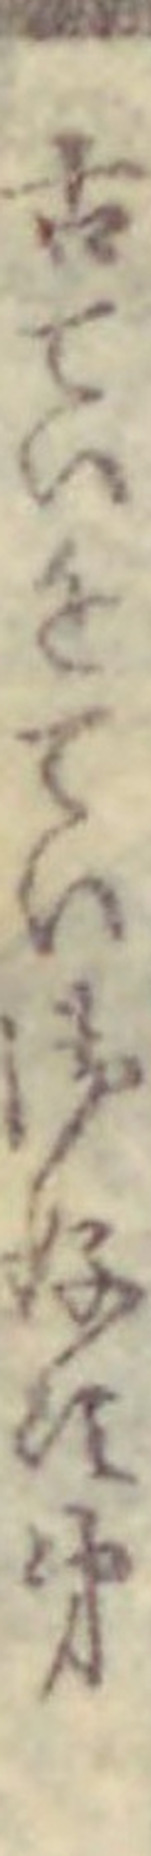古ていをてい御好次第
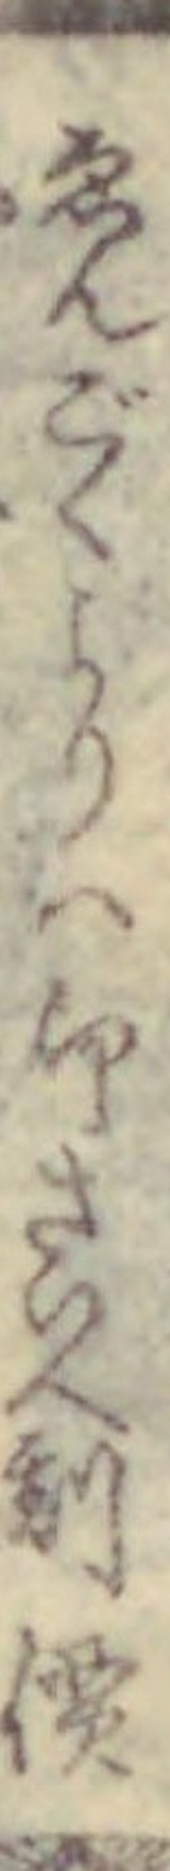ゑんごくよりは印さいへ刻價
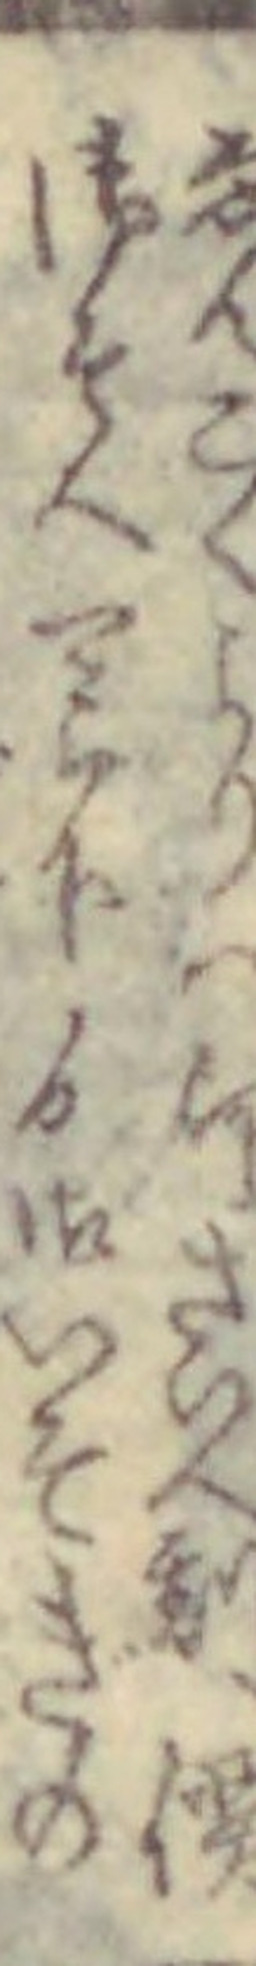御そへ可被下より御いそぎの
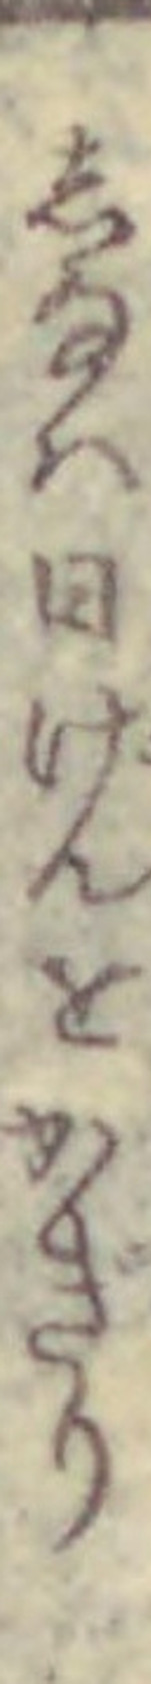しなは日げんをかぎり
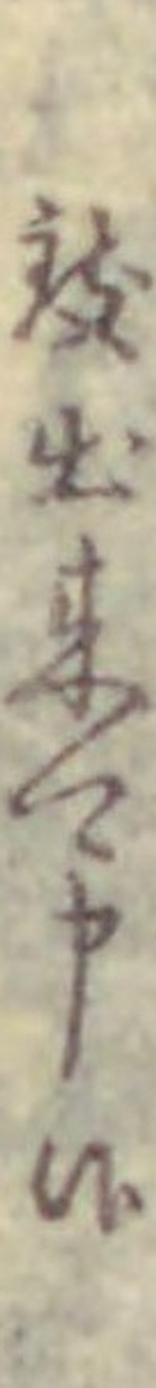被出来可申候
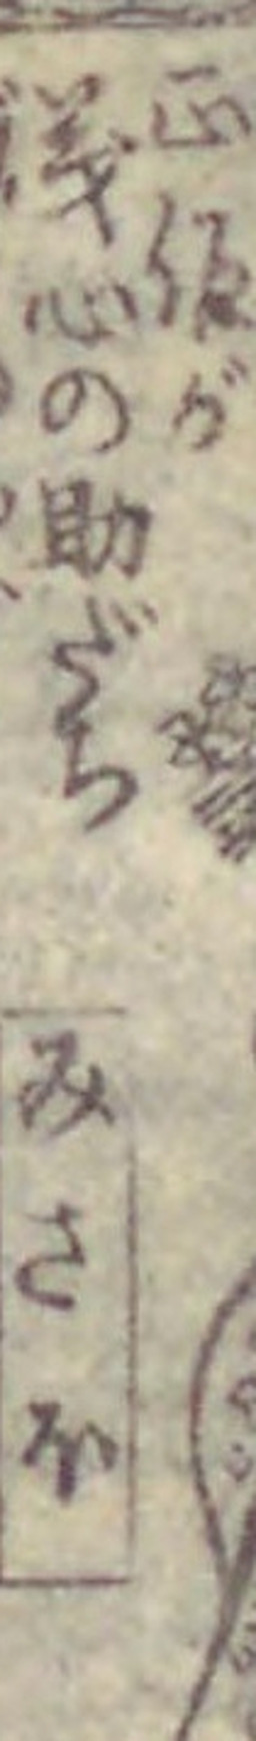義心の助だち
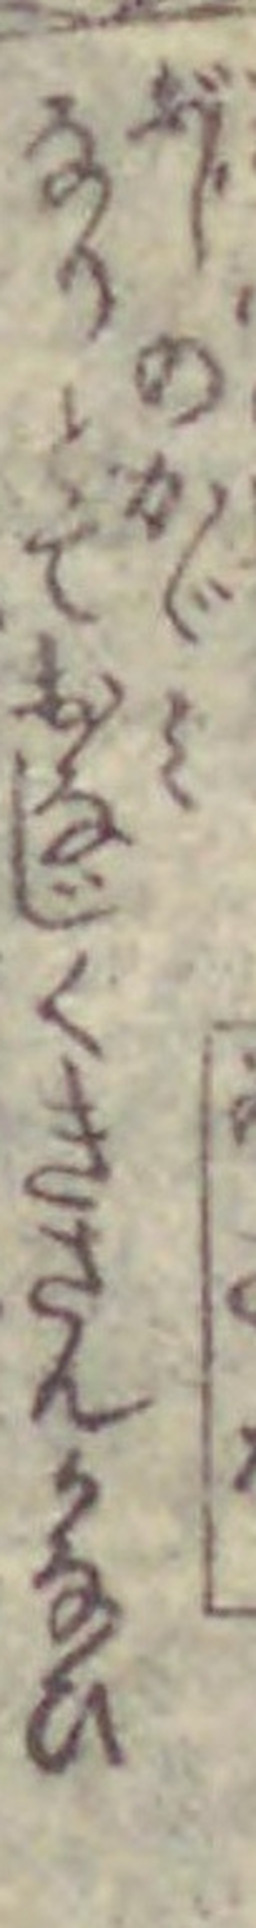なりとておなじくきさんかなひ
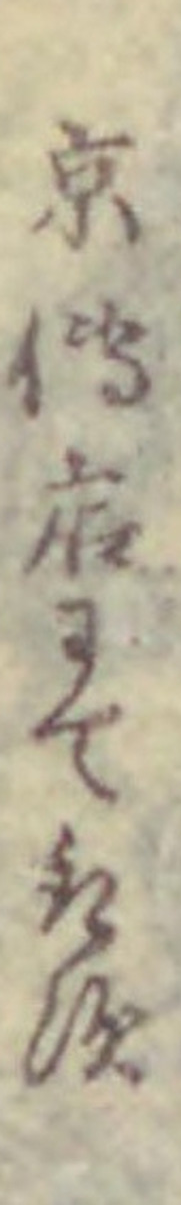京傳店にて取次
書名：八ツ目鱣因縁物語 3巻
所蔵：国立国会図書館 National Diet Library, JAPAN
